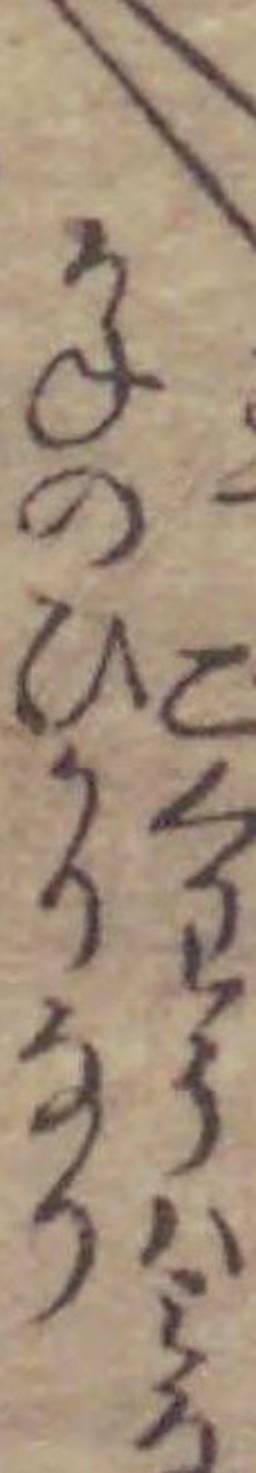かねのひかりなり
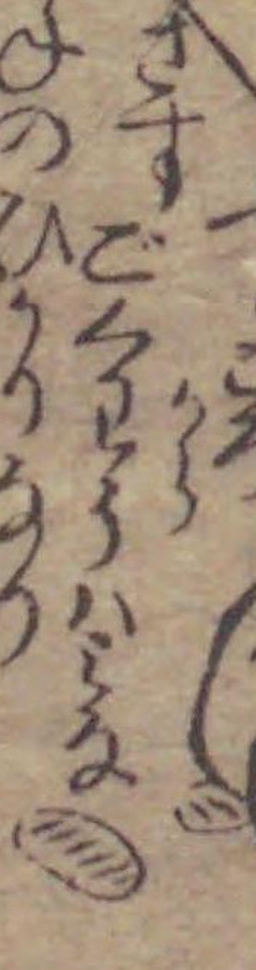かねのひかりなり
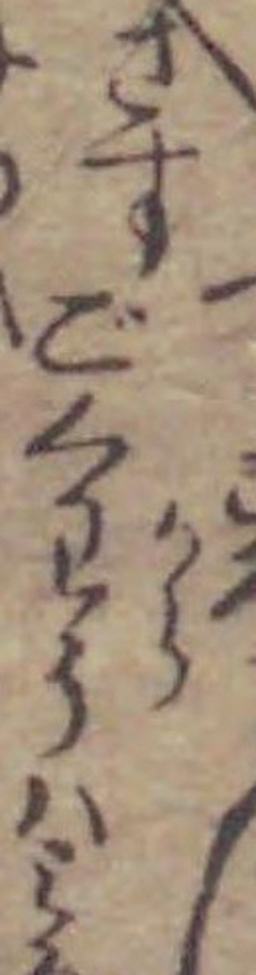ごくわうはみな
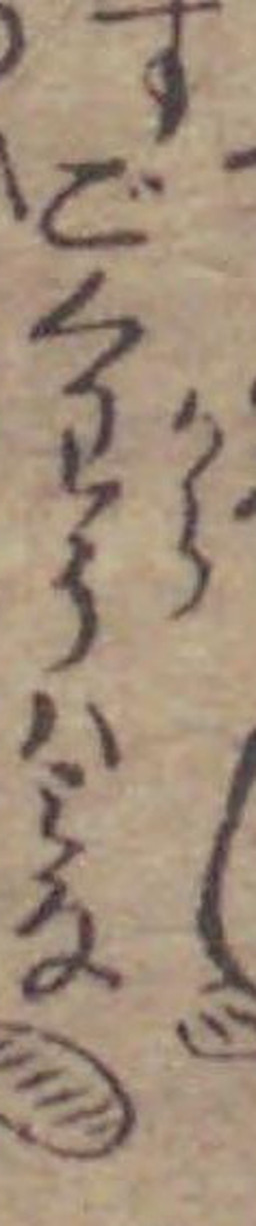ごくわうはみな
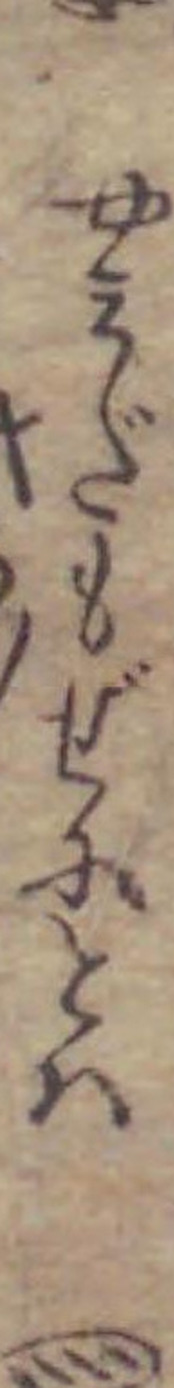やみだもぜにとは
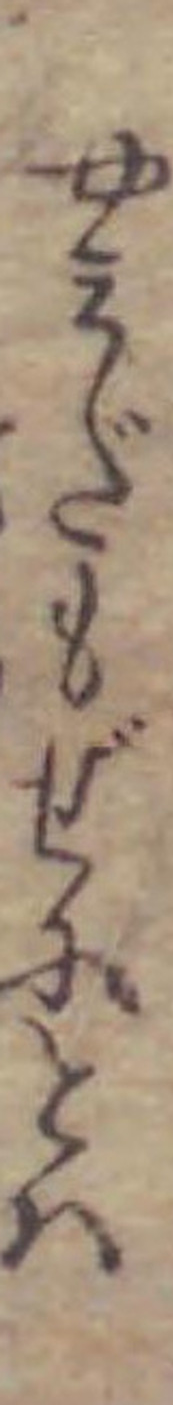やみだもぜにとは
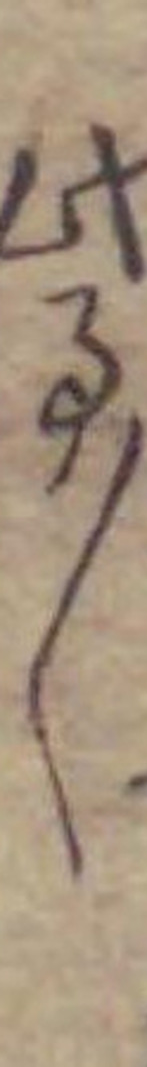此事〳〵

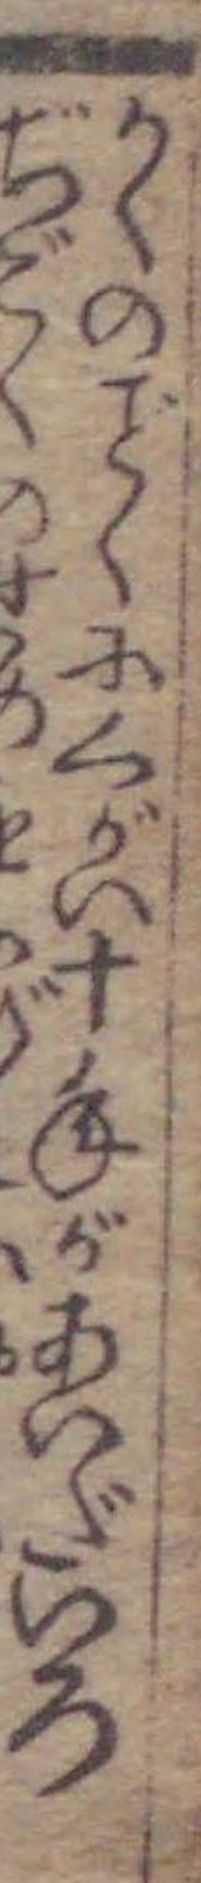かくのごとくにくがい十年があいだいろ
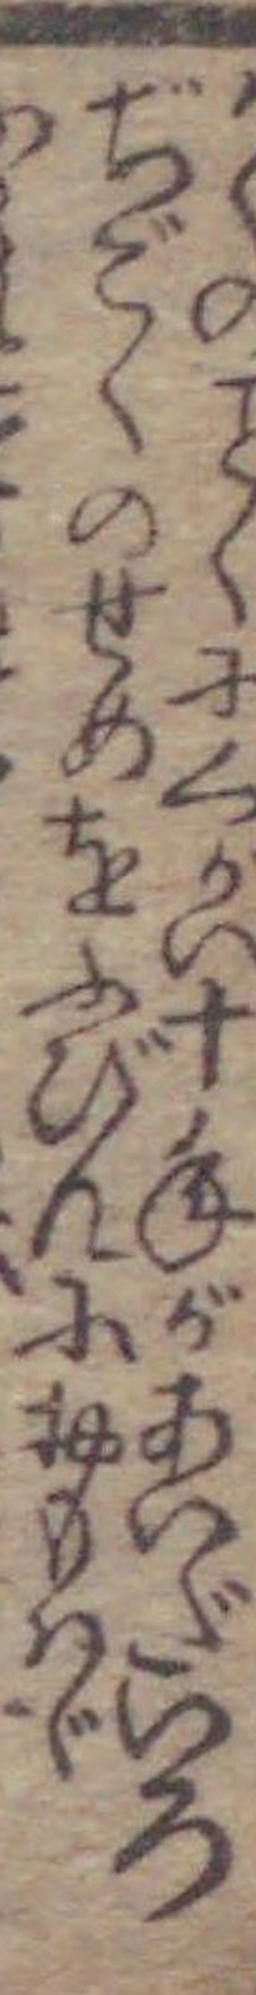ぢごくのせめをふびんにおもはば
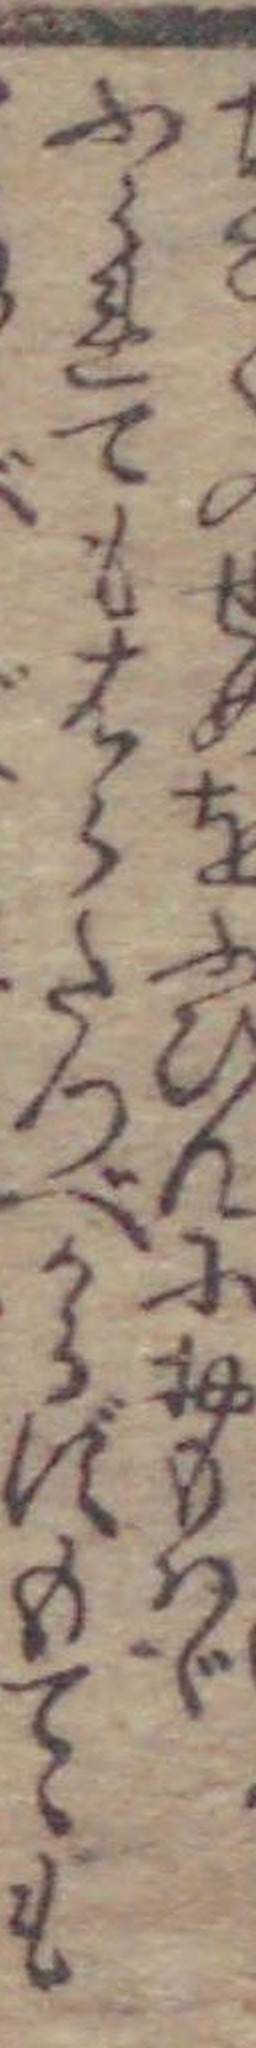ふられてもはらたつべからずもてゝも
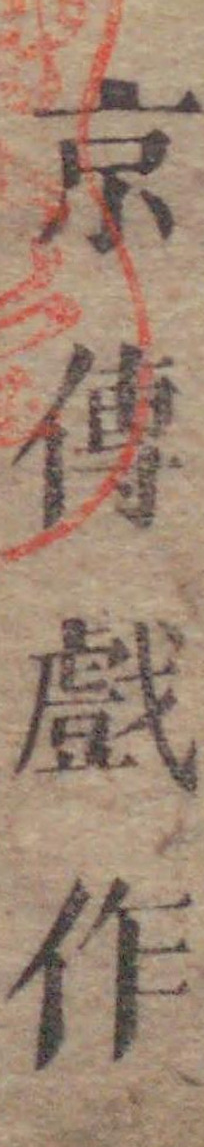京伝戯作
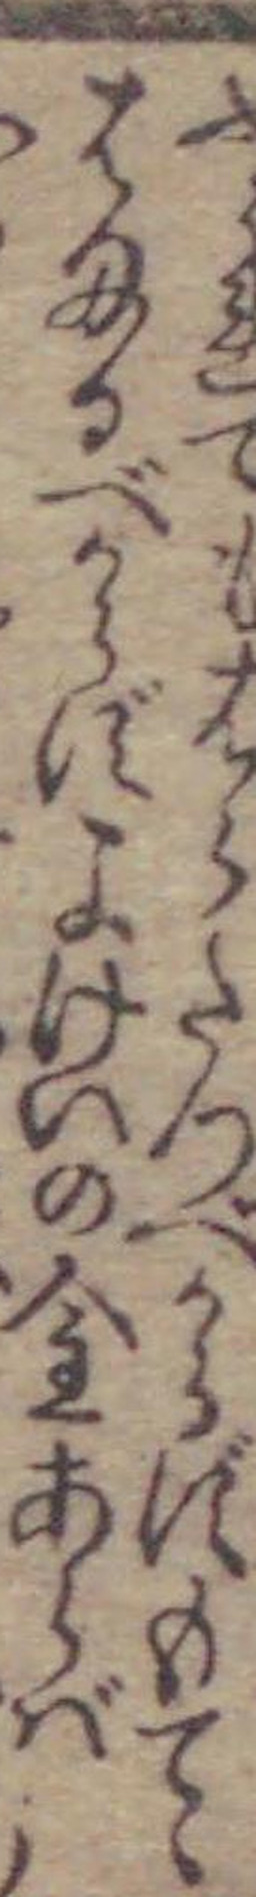はまるべからずよけいの金あらば
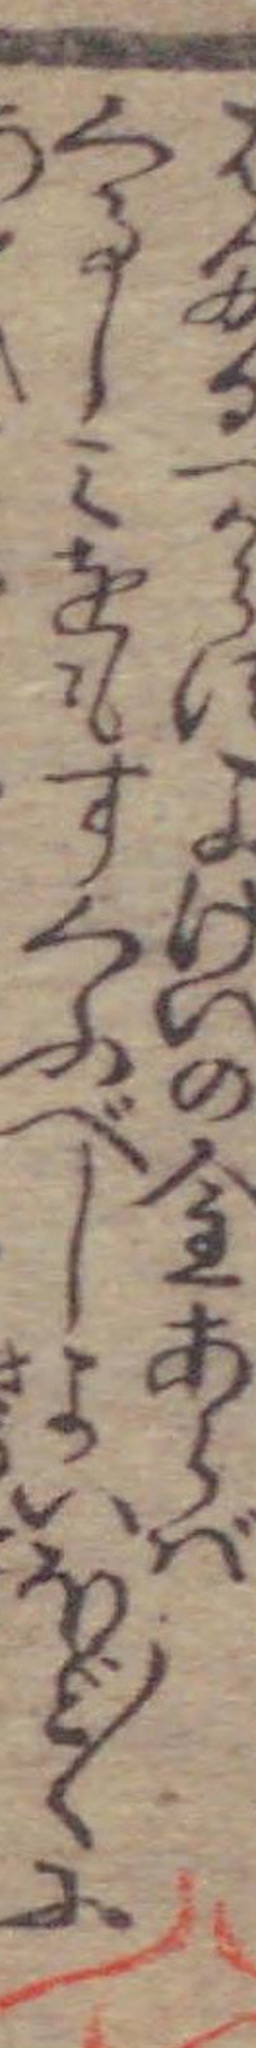くるしみをもすくふべしよいほど〳〵に
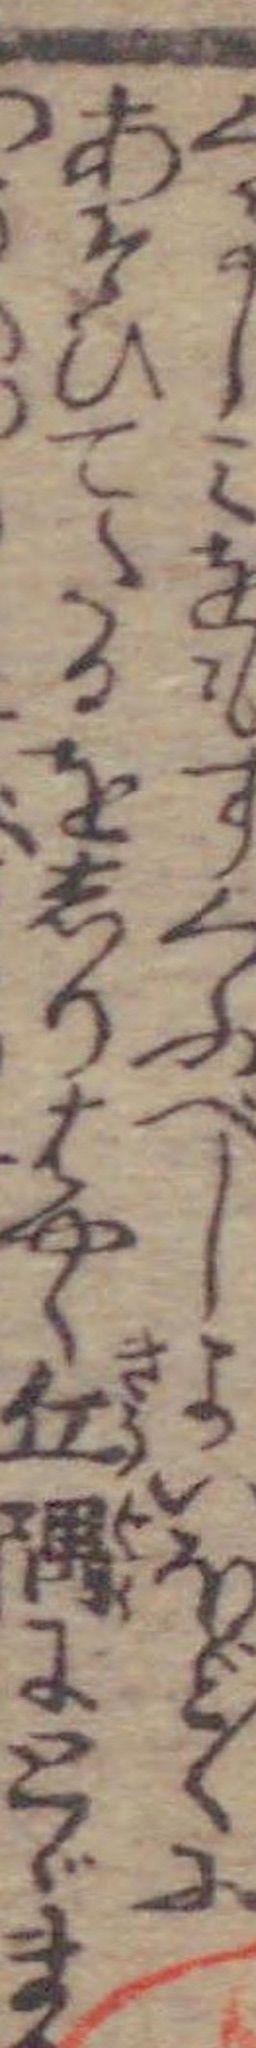あそひてたるをしりはやく丘隅にとゞまるべし
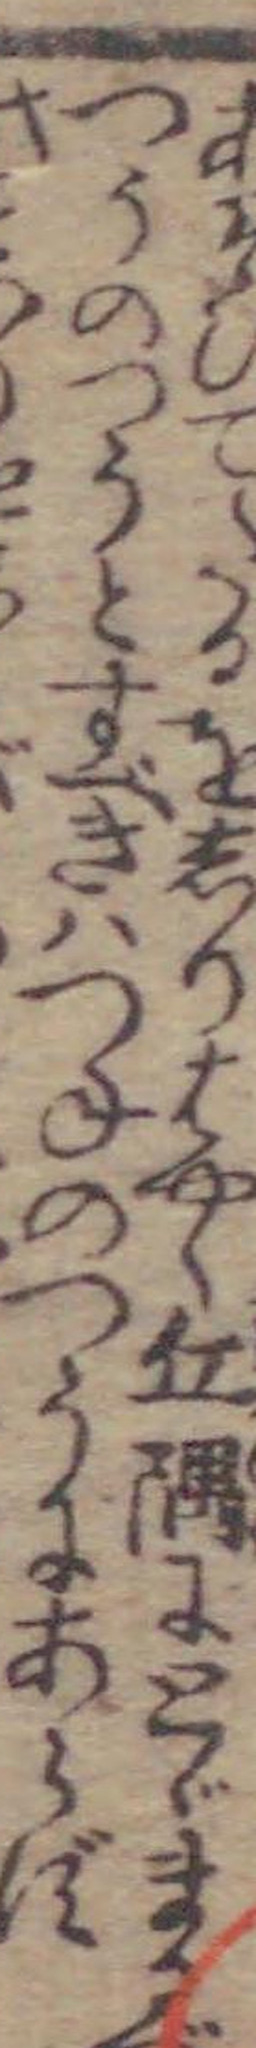つうのつうとすべきはつねのつうにあらず
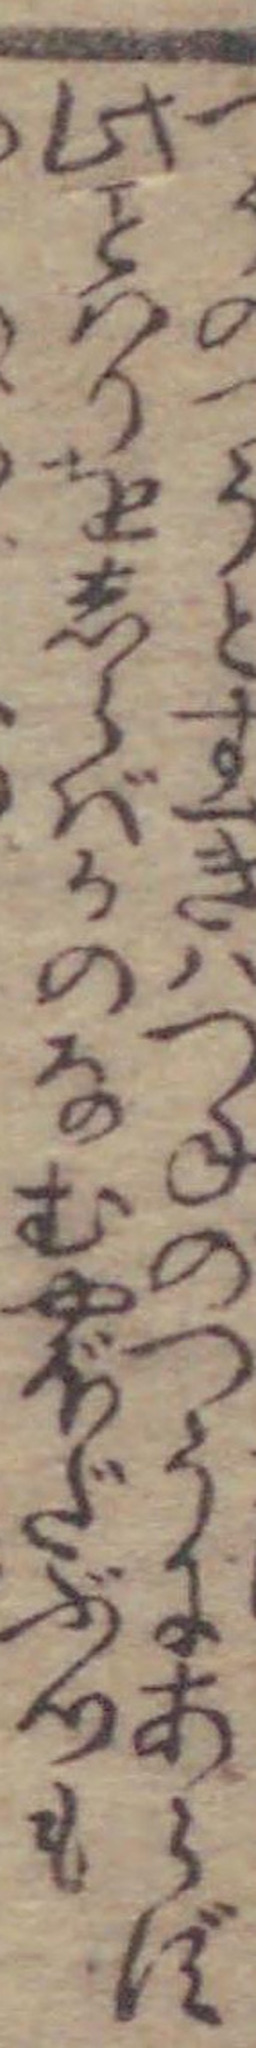此ことはりをしらばかのなむやぼだぶつも
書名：九替十年色地獄 : 3巻
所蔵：国立国会図書館 National Diet Library, JAPAN
